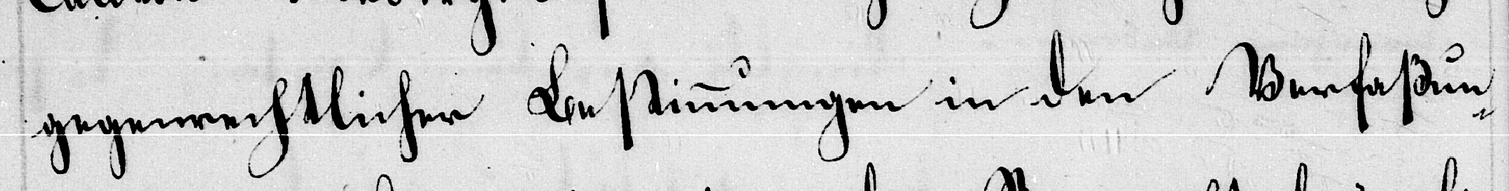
gegenrechtlicher Bestimmungen in den Verfaßun¬
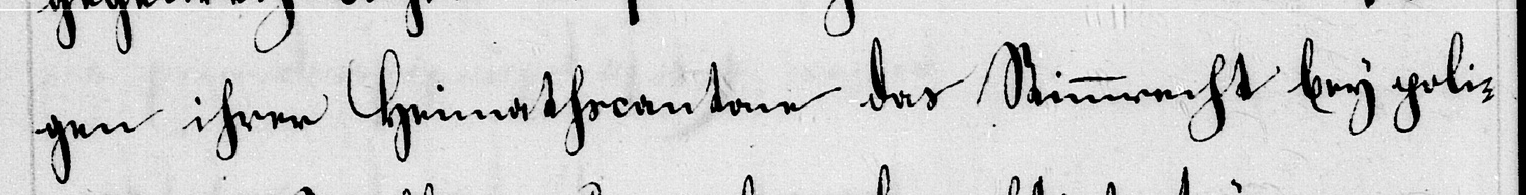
gen ihrer Heimathscantone das Stimmrecht bey poli¬
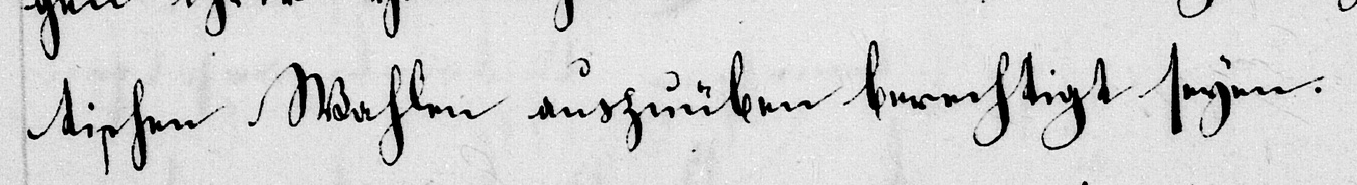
tischen Wahlen auszuüben berechtigt seyen.
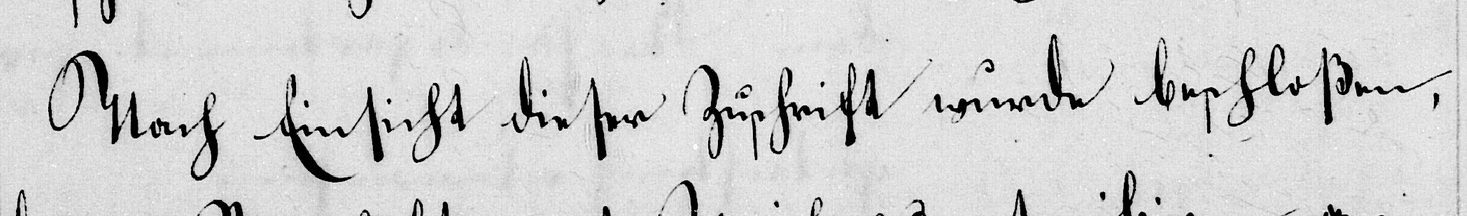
Nach Einsicht dieser Zuschrift wurde beschloßen,
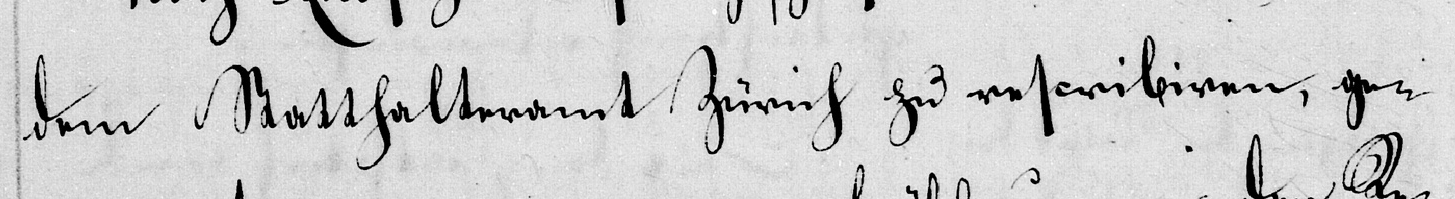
dem Statthalteramt Zürich zu rescribiren, ge¬
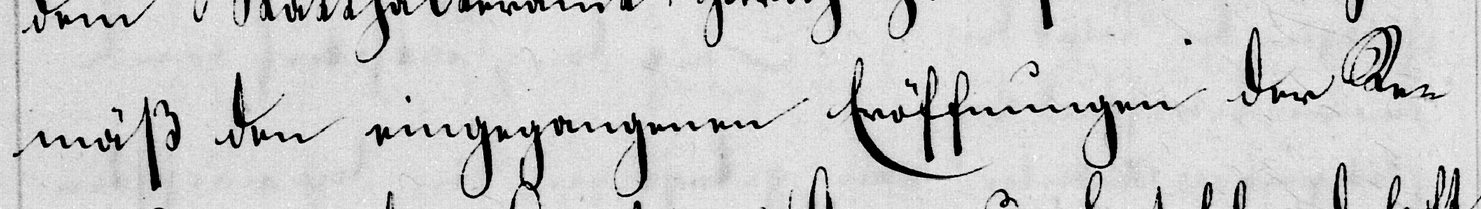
mäß den eingegangenen Eröffnungen der Re¬
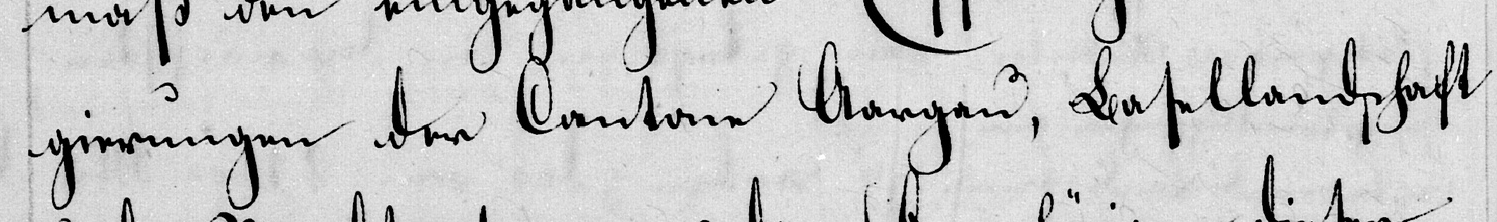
gierungen der Cantone Aargau, Basellandschaft
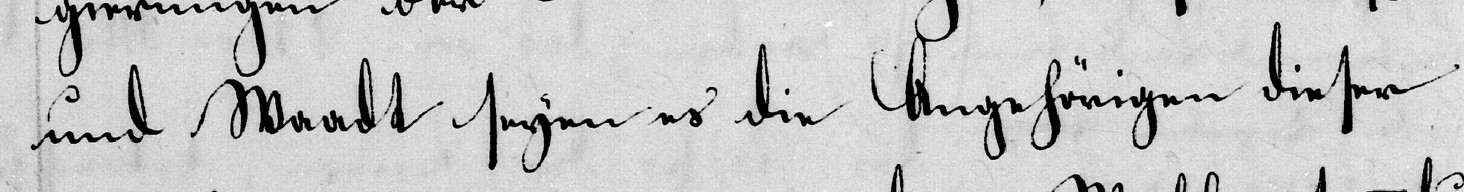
und Waadt seyen es die Angehörigen dieser
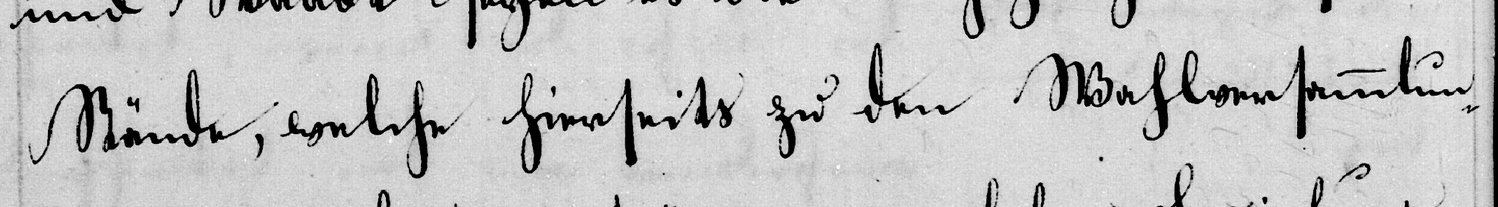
Stände, welche hierseits zu den Wahlversammlun¬
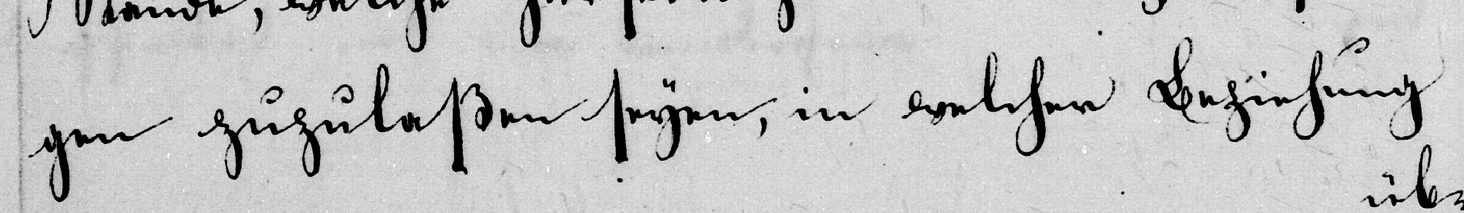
gen zuzulaßen seyen, in welcher Beziehung
